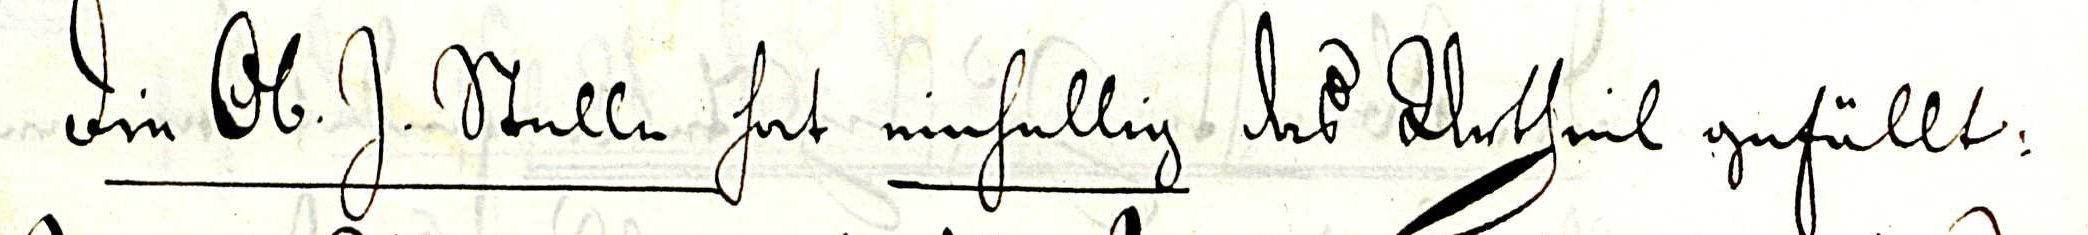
Die Ob. J. Stelle hat einhellig das Urtheil gefällt:
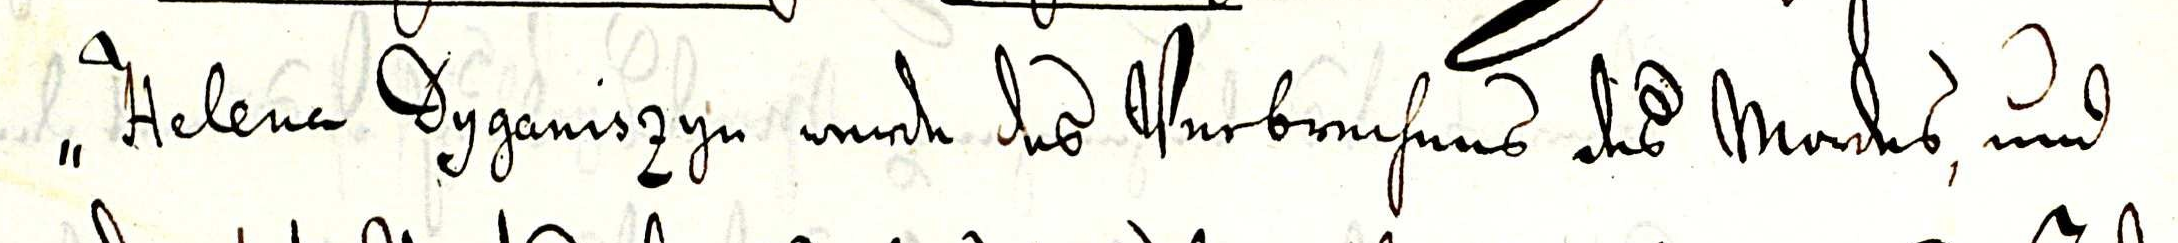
„Helena Dyganiszyn werde des Verbrechens des Mordes
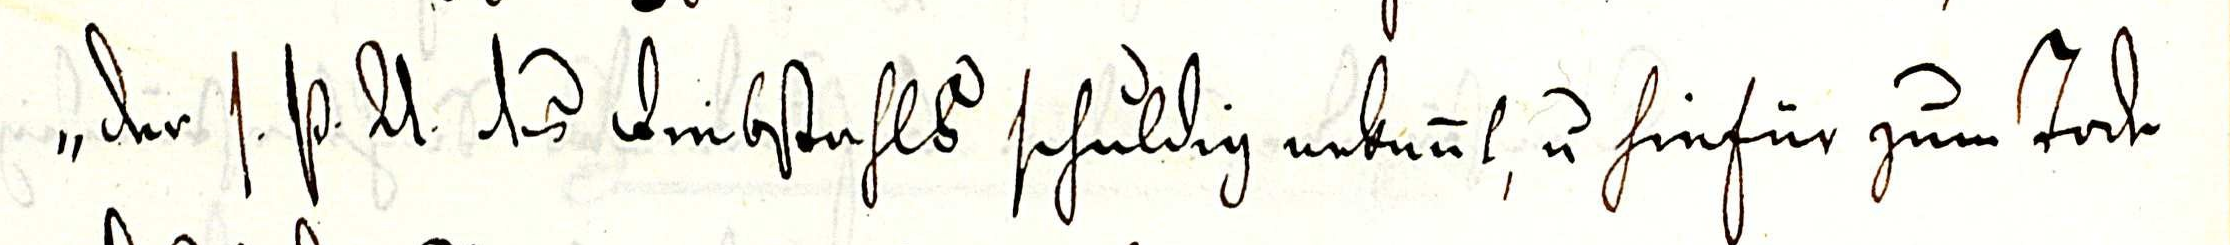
und der 1.st. U. des Diebstahls schuldig erkannt u hiefür zum Todes
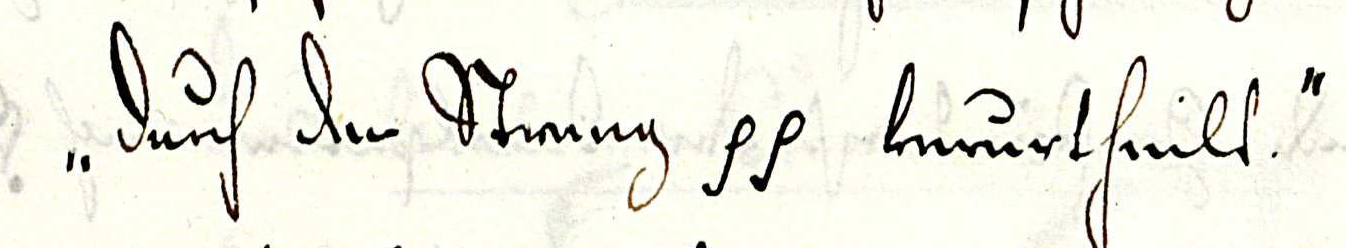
durch den Strang pp verurtheilt.“
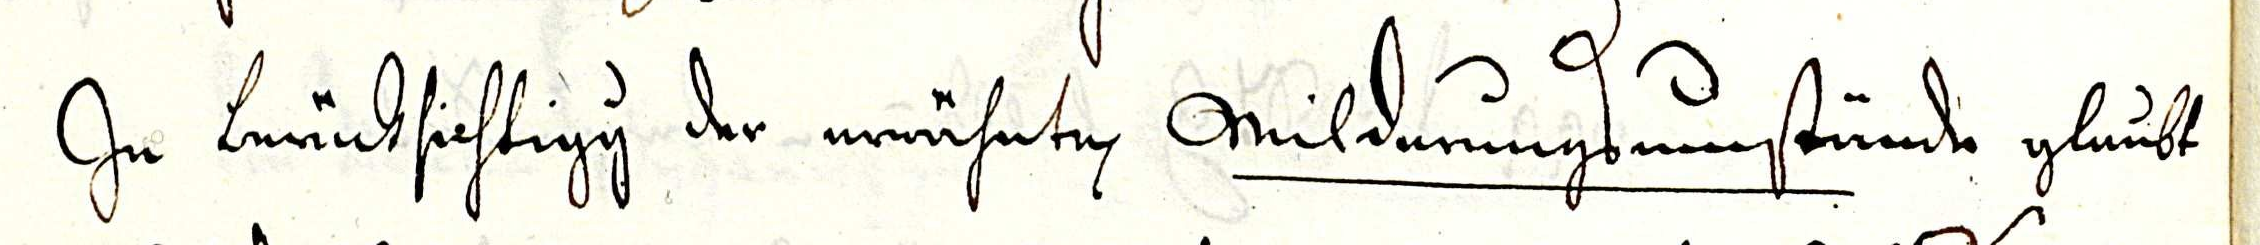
In Berücksichtigg der erwähnten Milderungsumstände glabut
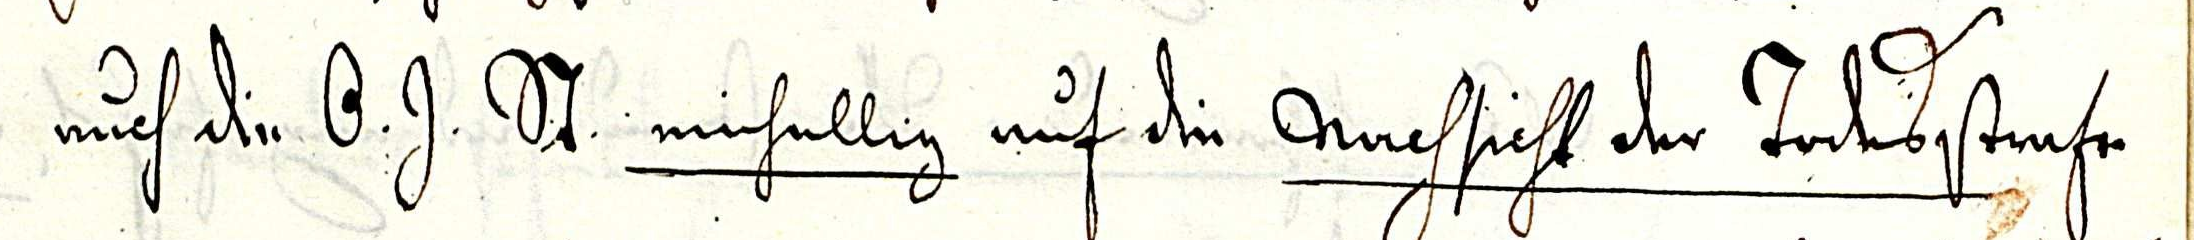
auch die O. J. St. Einhellig auf die Nachsicht er Todesstrafe
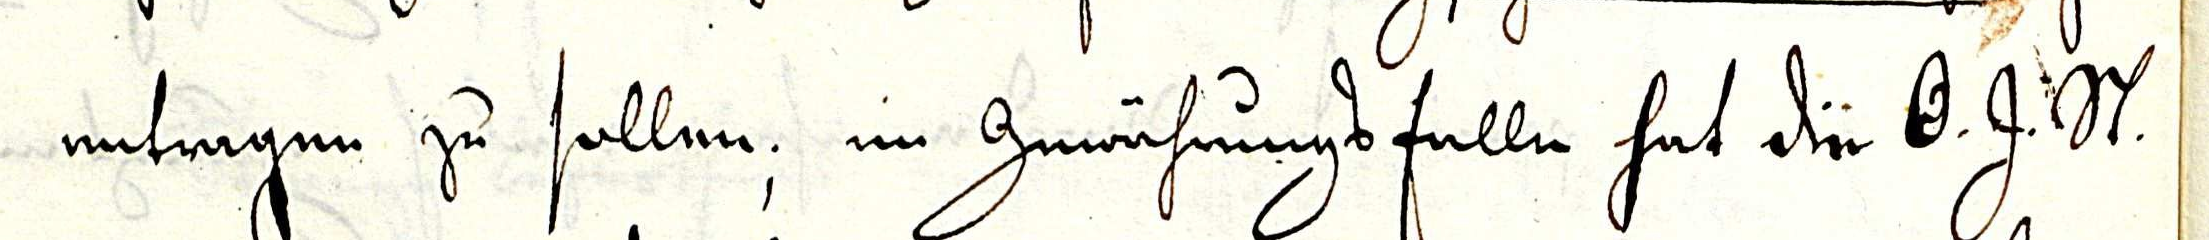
antragen zu sollen; im Gewährungsfalle hat die O.J.St.
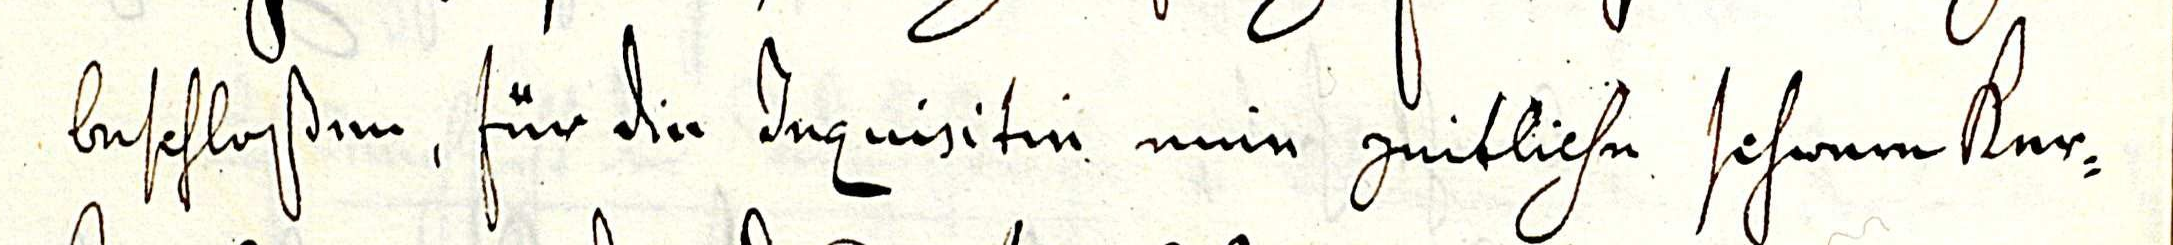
beschloßen, für die Inquisitin eine zeitliche schwere Ker¬
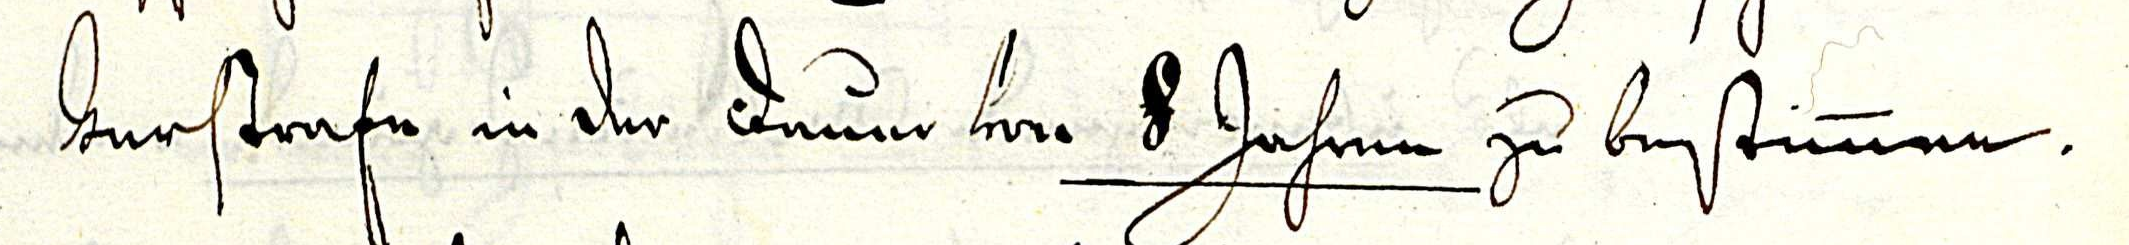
kerstrafe in der Dauer vom 8 Jahren zu bestimmen.
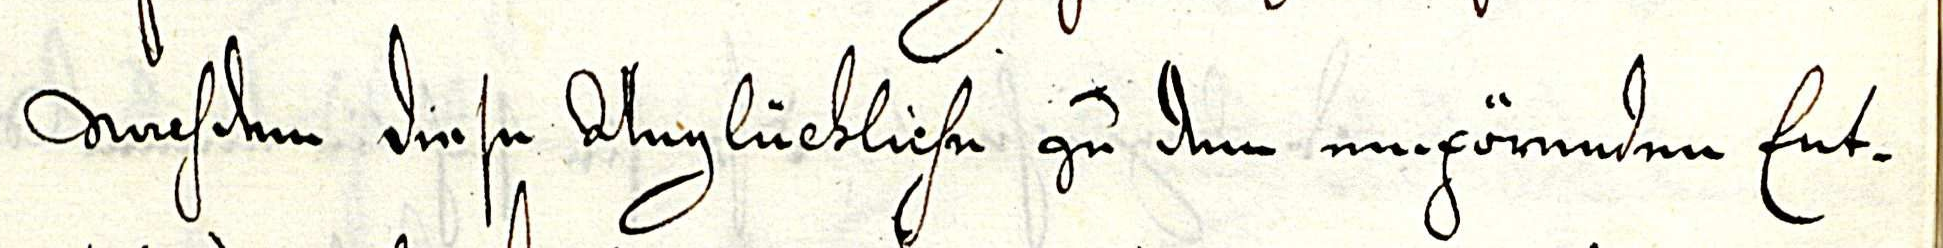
Nachdem diese Unglückliche zu dem empörenden Ent¬
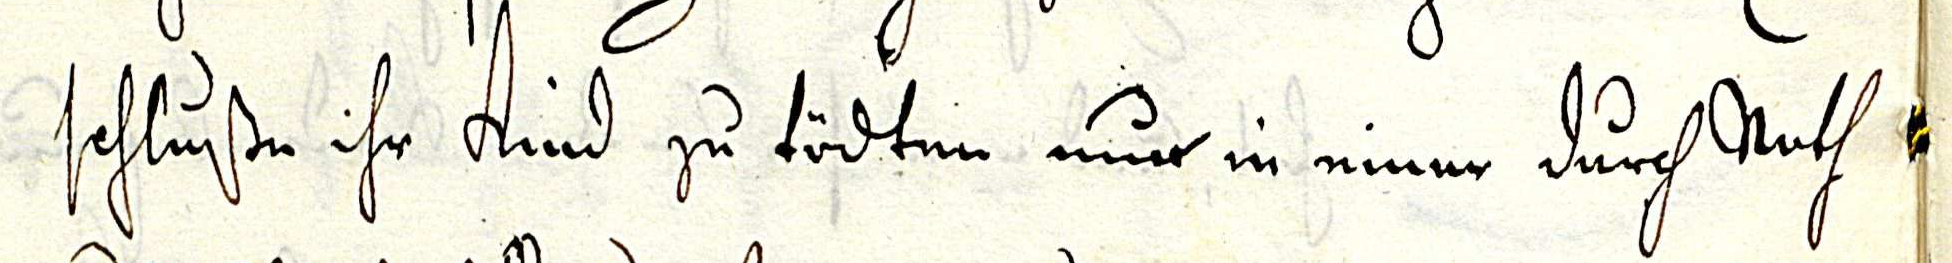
schluße ihr Kind zu tödten nur in einer durch Noth
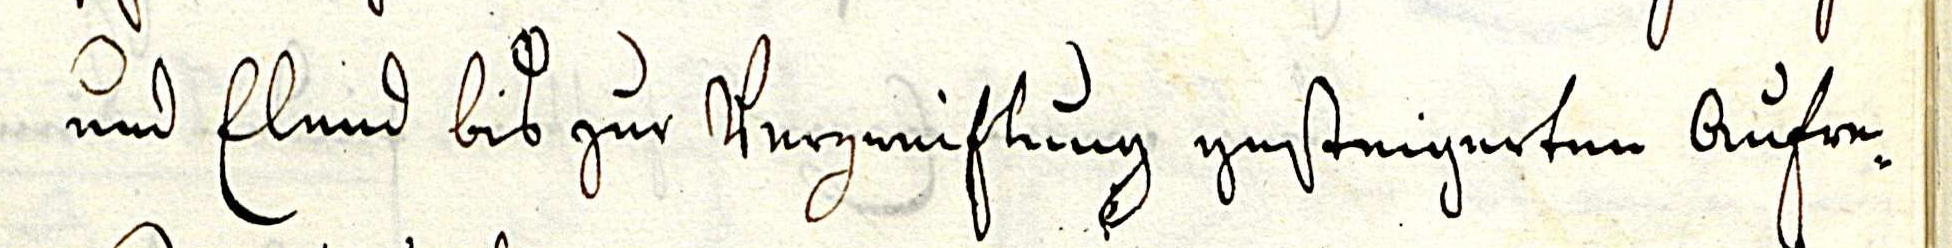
und Elend bis zur Verzweiflung gesteigerten Aufre¬
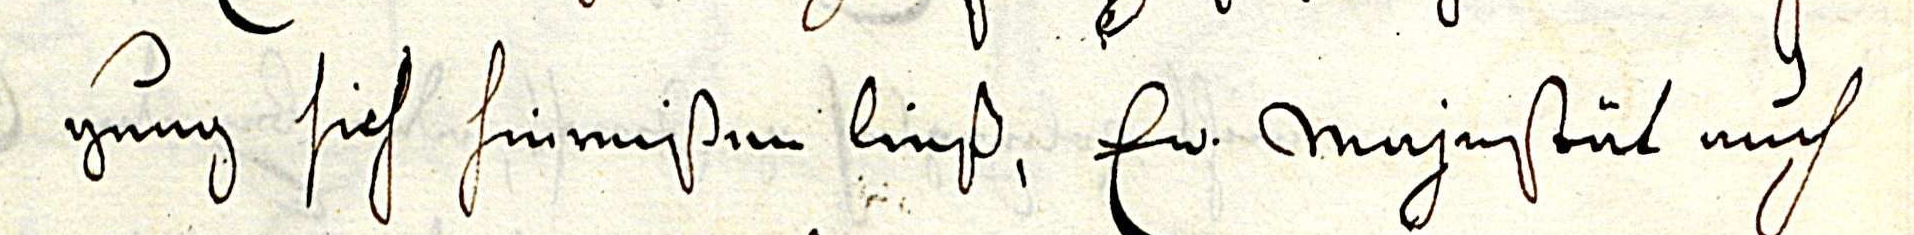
gung sich hinreißen ließ, Ew. Majestät auch
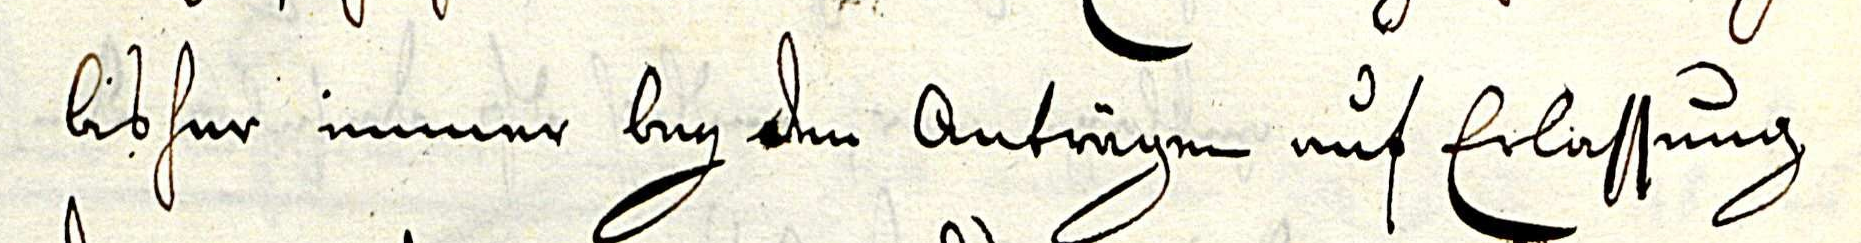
bisher immer bey den Anträge auf Erlassung
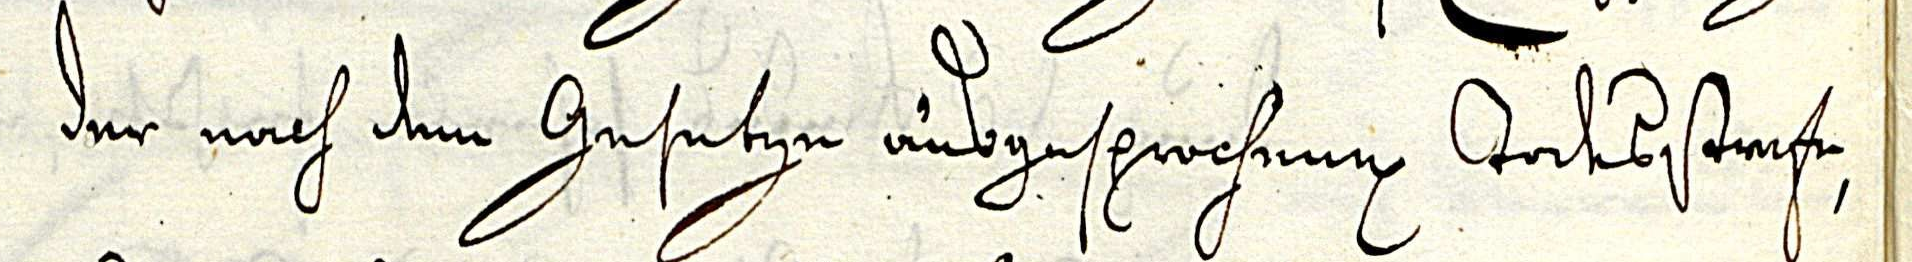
der nach dem Gesetze ausgesprochene Todesstrafe,
